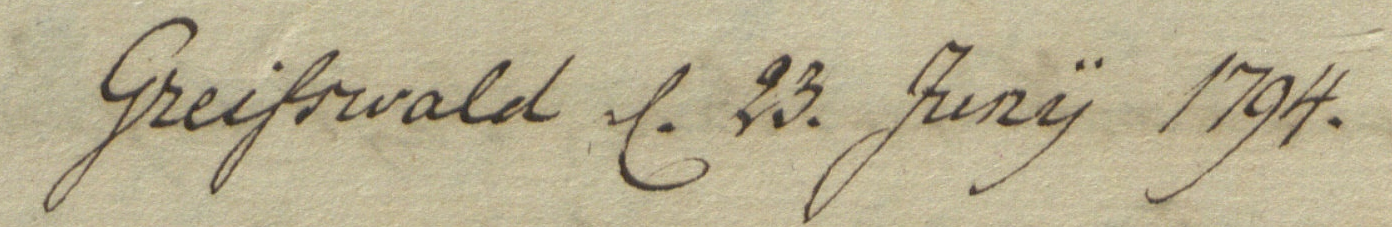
Greifswald d. 23. Juny 1794
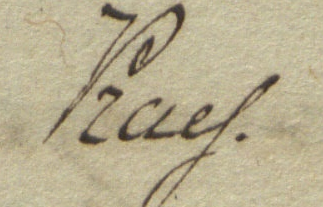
Praes
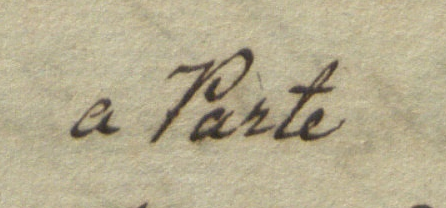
a Parte
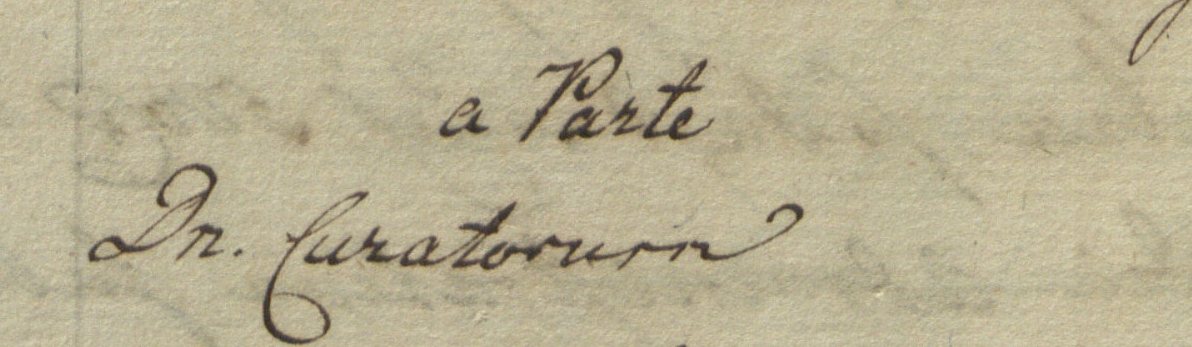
Dn. Curatorum
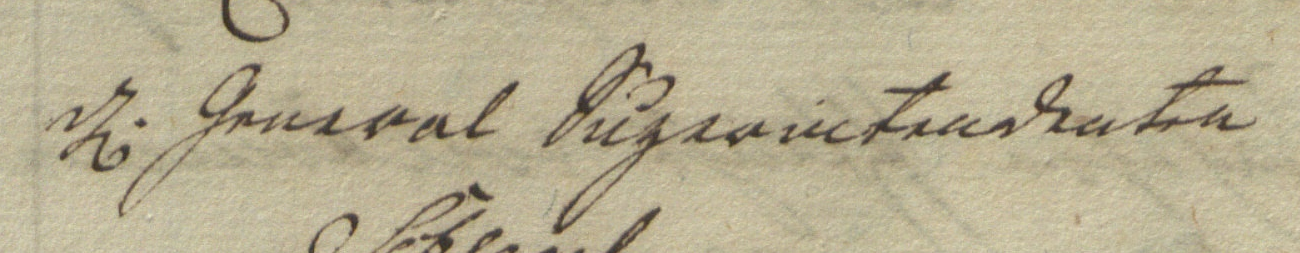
dh. General Superintendentne
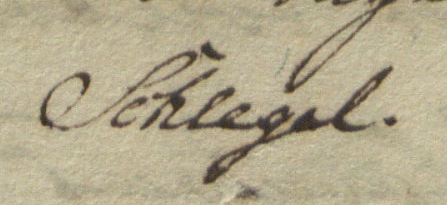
Schlegel
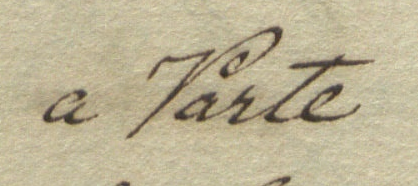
a Parte
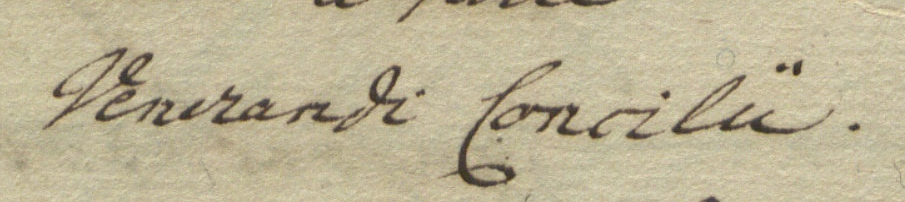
Venerandi Concilii
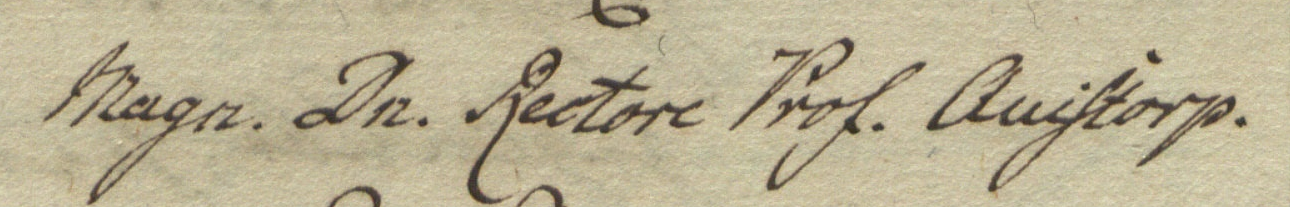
Magn. Dn. Rectore Prof. Quistorp
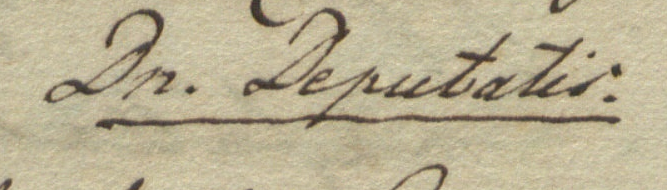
Dn. Deputatis.
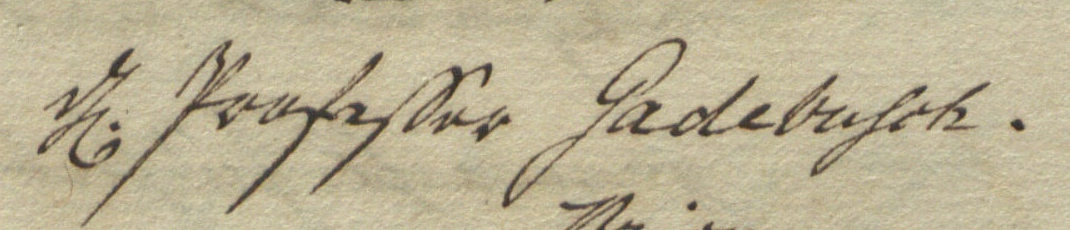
dh. Professor Gadebusch.
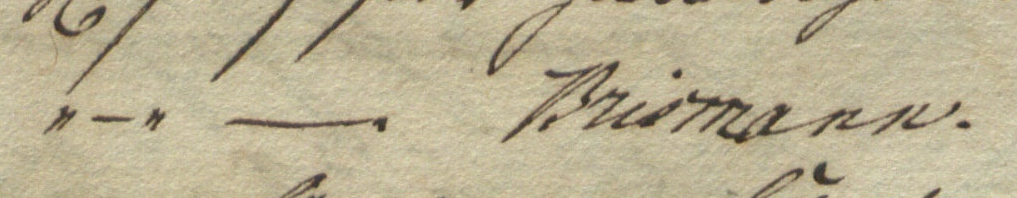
" - " - " Brismann.
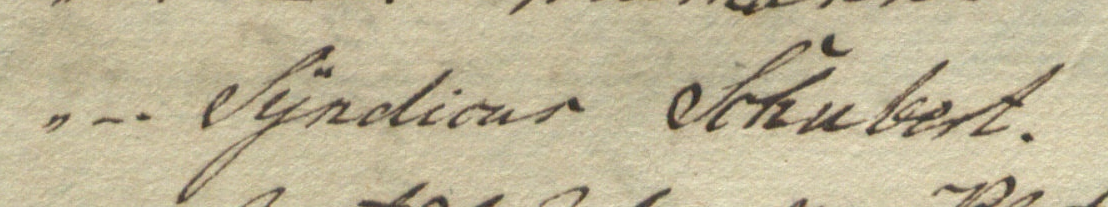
" - " Syndicus Schubert
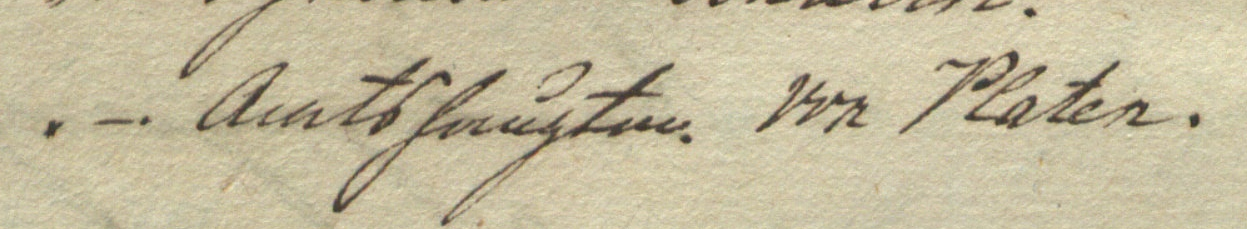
" - " Amtshauptm. von Platen.
